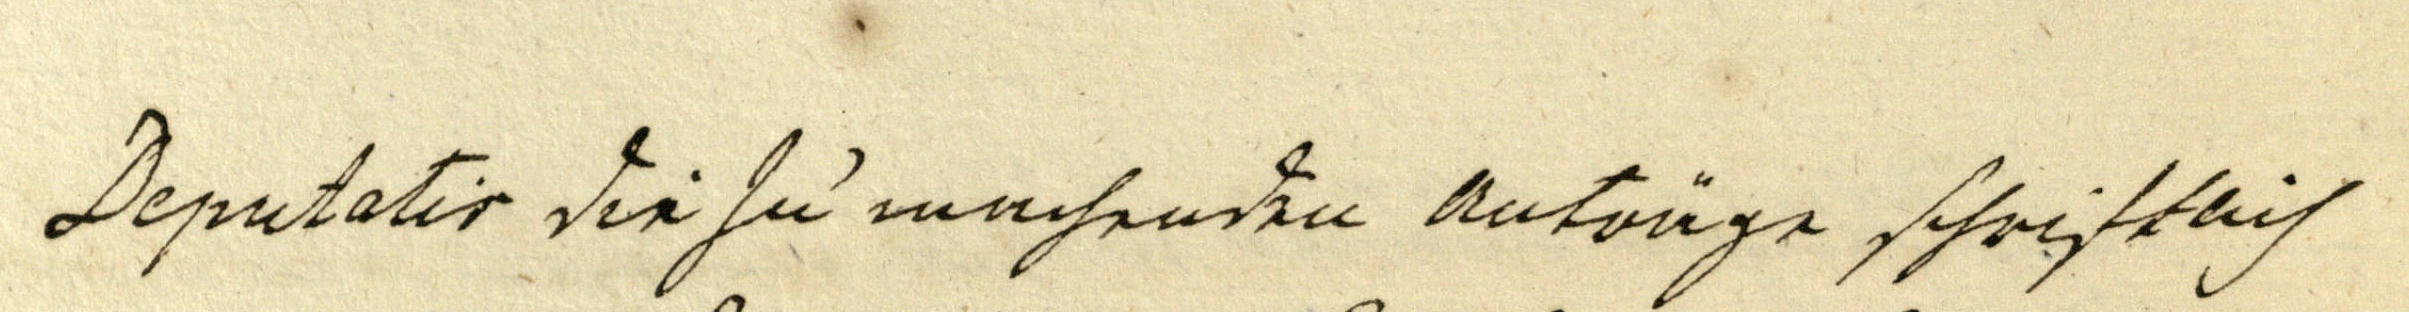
Deputatis die zu machenden Anträge schriftlich
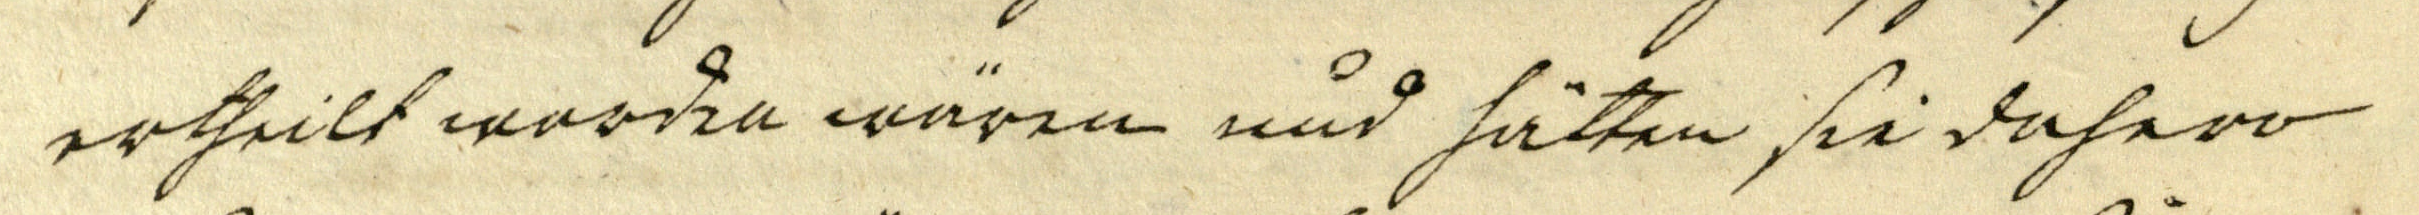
ertheilt worden wären und hätten sie dahero
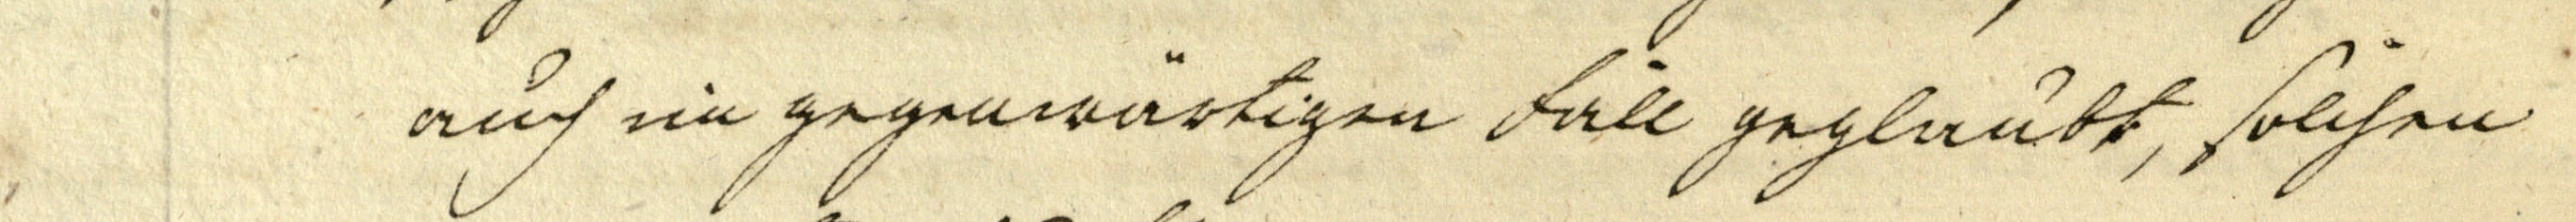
auch im gegenwärtigen Fall geglaubt, solchen
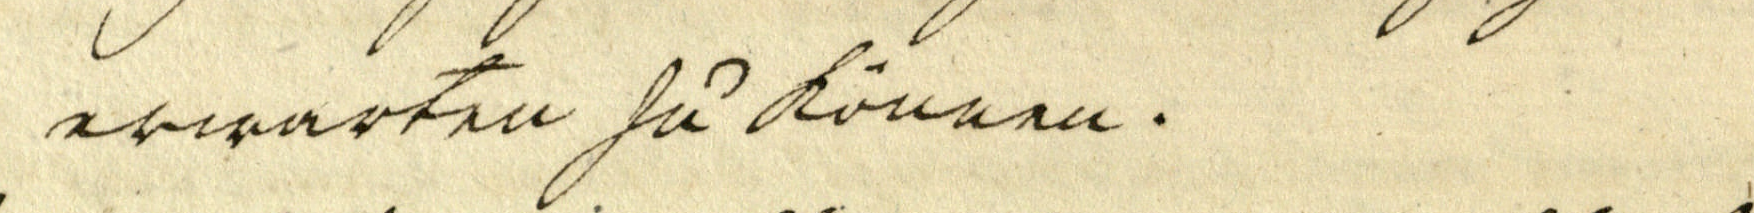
erwarten zu können.
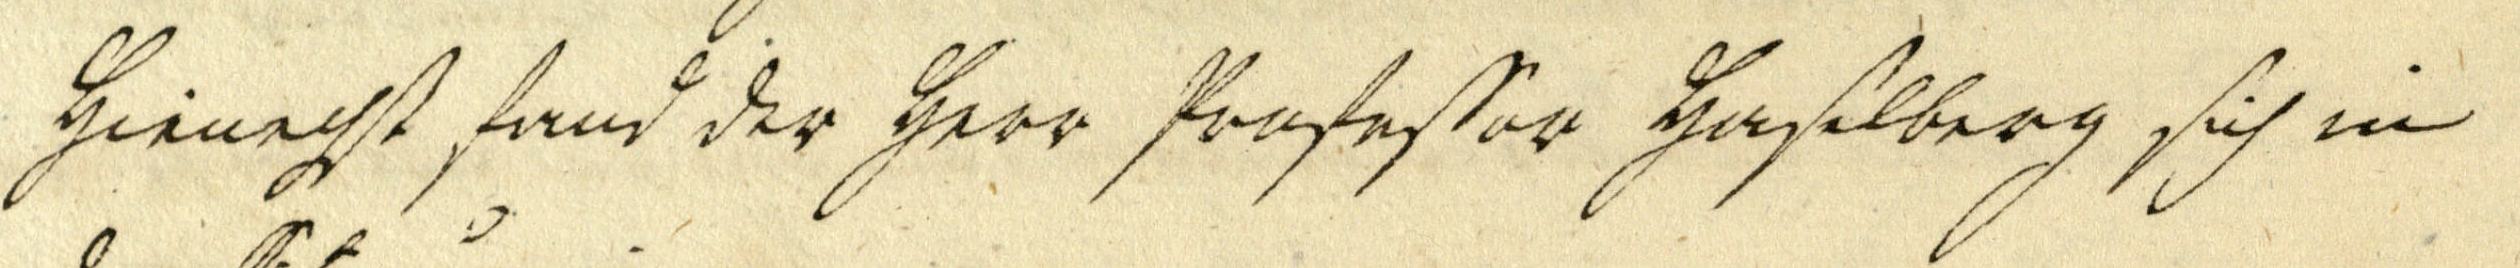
Hienechst fand der Herr Professor Haselberg sich in
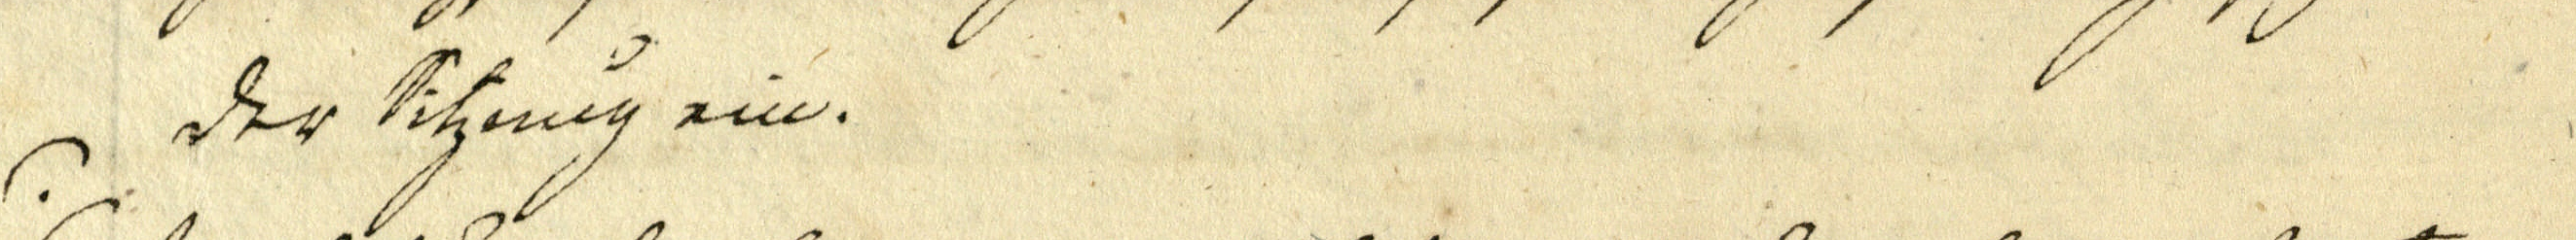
der Sitzung ein.
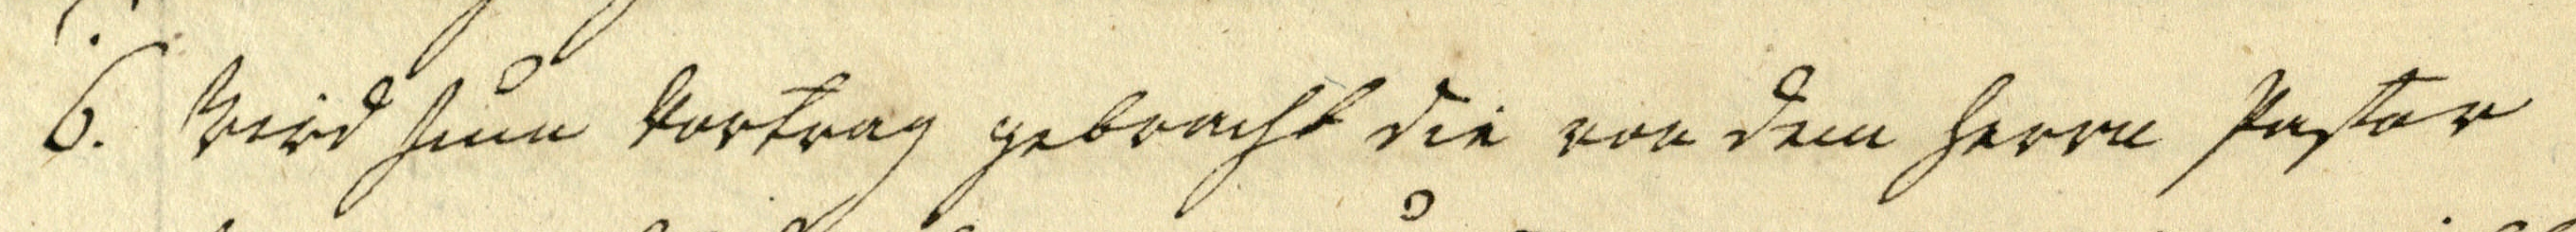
6. Wird zum Vortrag gebracht die von dem herrn Pastor
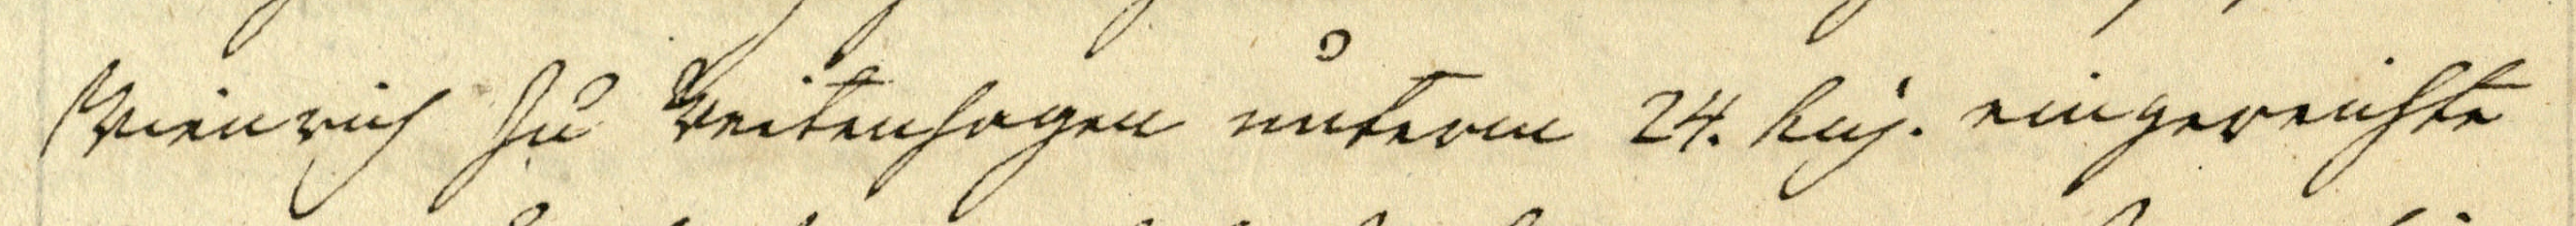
Wienrich zu Weitenhagen unterm 24. huj. eingereichte
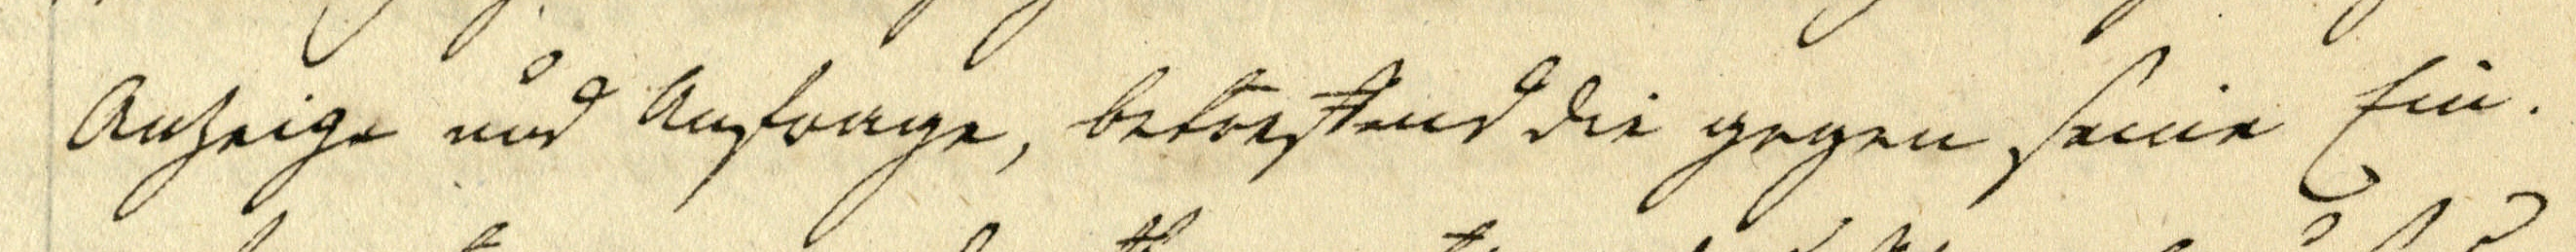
Anzeige und Anfrage, betreffend die gegen seine Ein¬
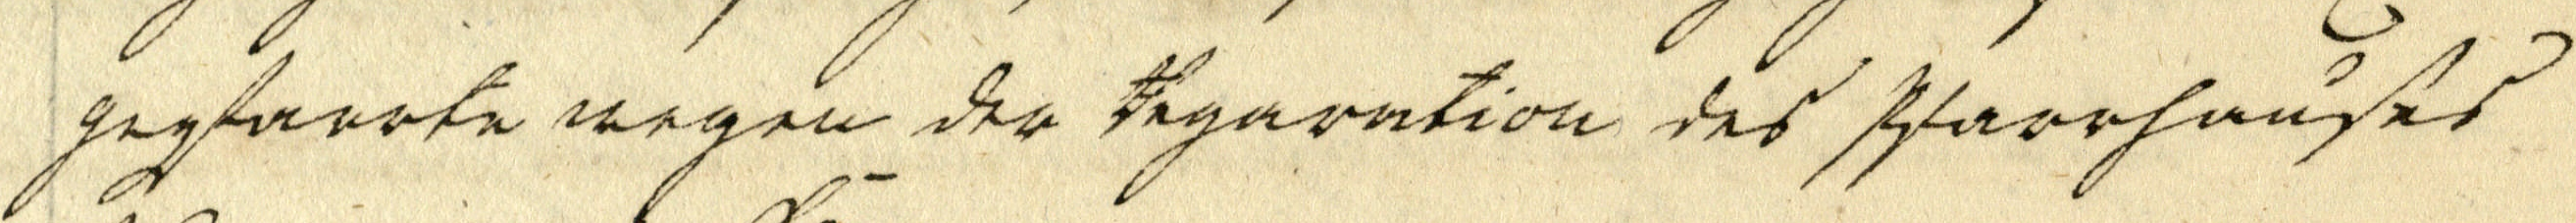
gepfarrte wegen der Reparation des Pfarrhauses
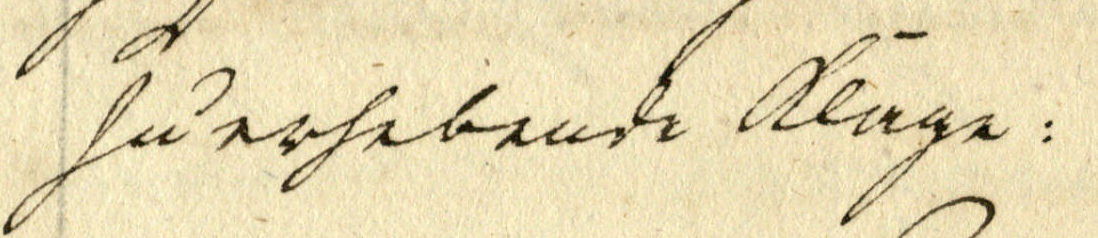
zu erhebende Klage:
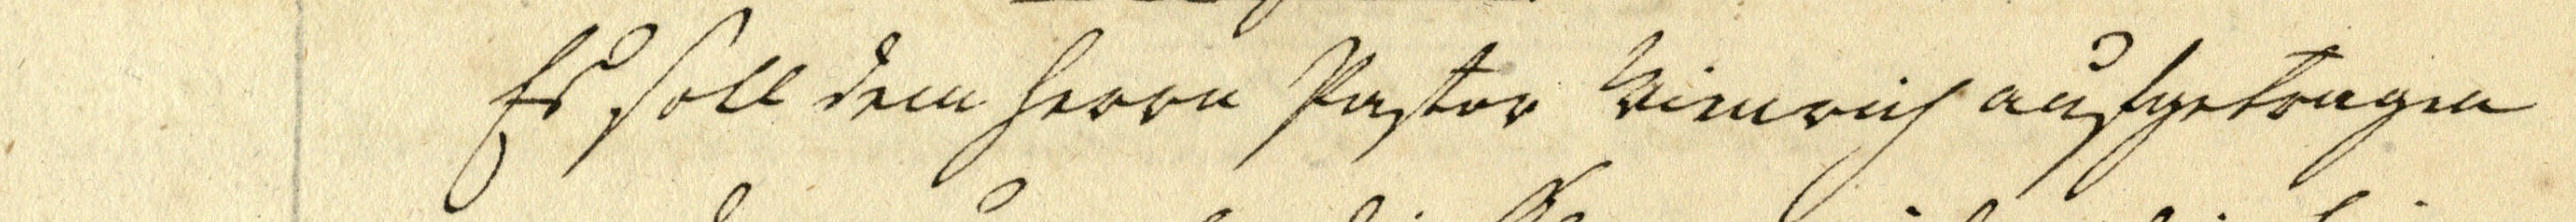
Es soll dem herrn Pastor Wienrich aufgetragen
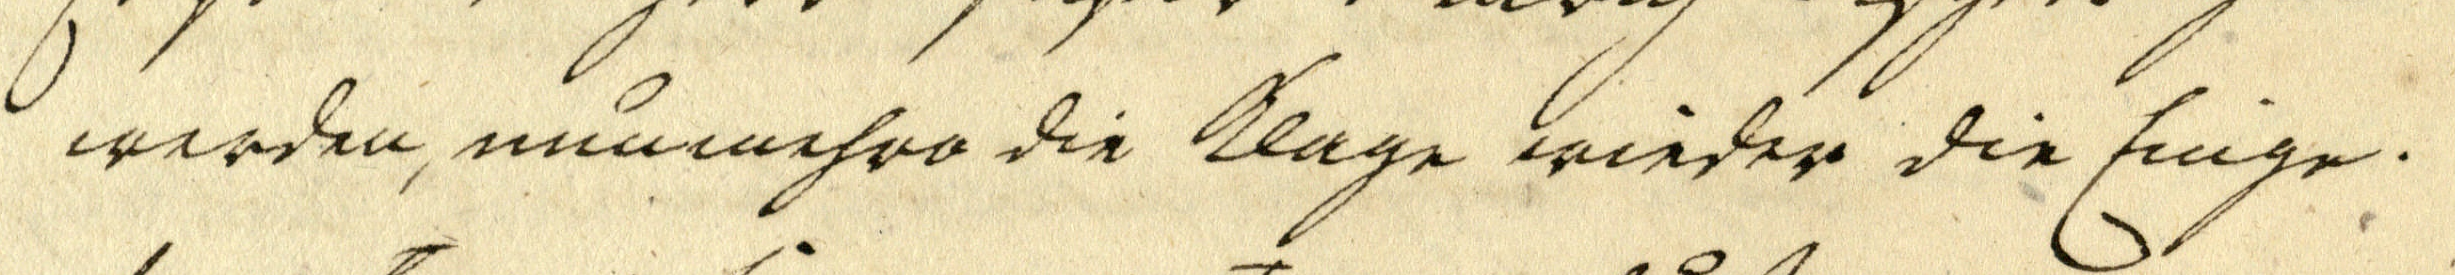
werden, nunmehro die Klage wieder die Einge¬
